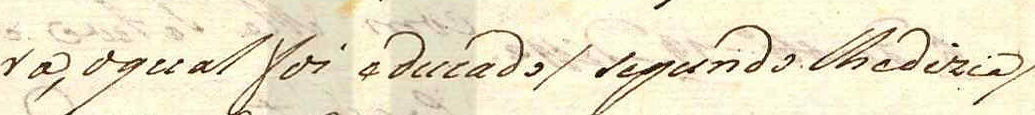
ra, o qual foi educado/ segundo lhe dizia/
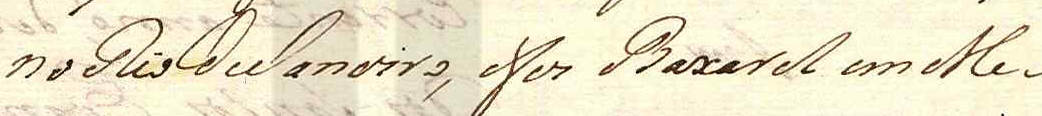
no Rio de Ianeiro, e fes Baxarel em Me
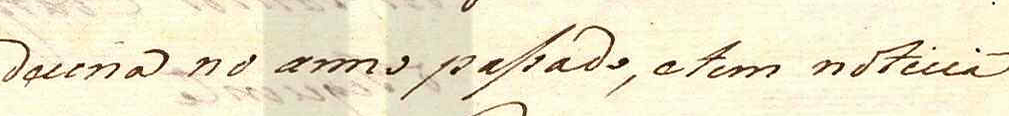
decina no anno paSsado, e tem noticia
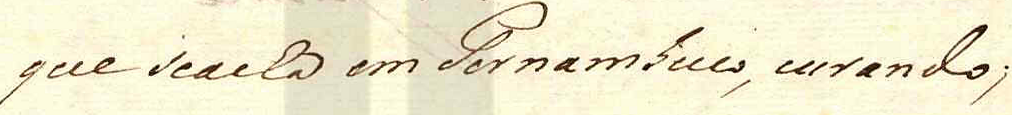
que se acha em Pernambuco, curando;
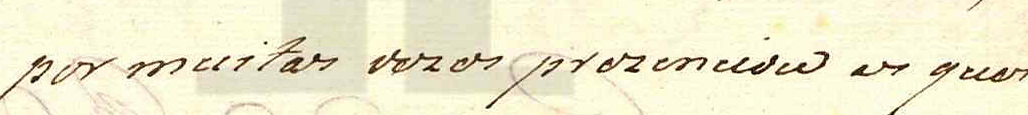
por muitas vezes prezenciou as ques
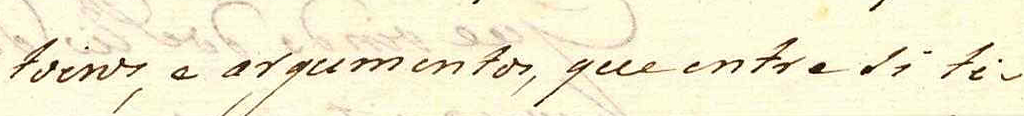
toins, e argumentos, que entre si ti
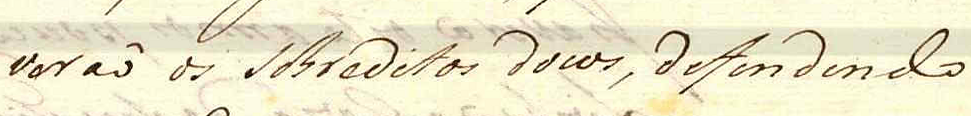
veraõ os sobreditos dous, defendendo
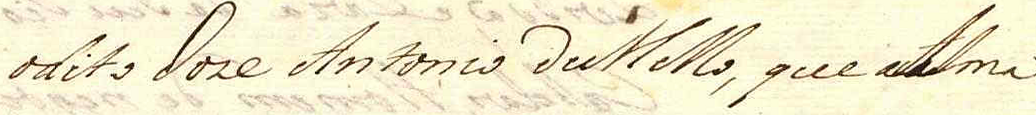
o dito Ioze Antonio de Mello, que a Alma
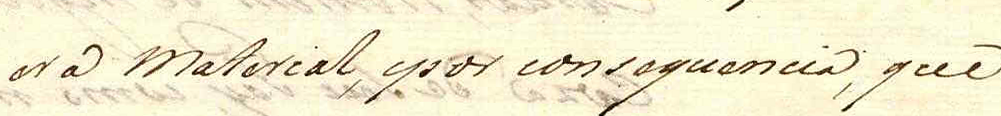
era material, e por consequencia, que
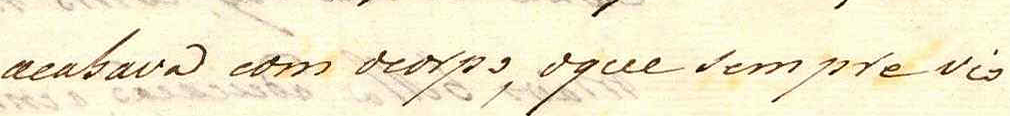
acabava com o corpo, o que sempre vio
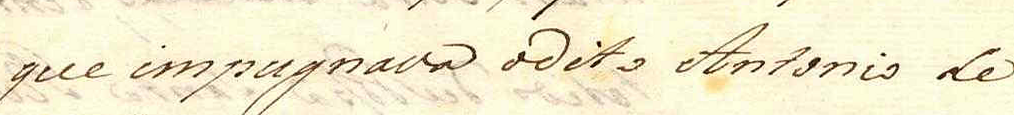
que impugnava o dito Antonio de
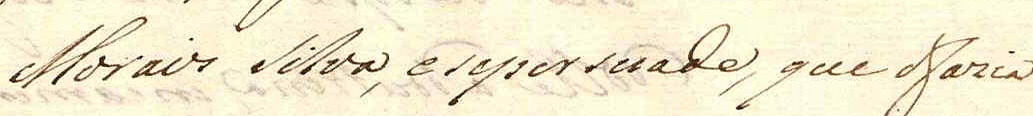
Morais Silva, e sepersuade, que o fazia
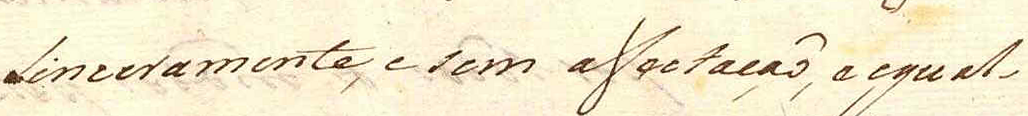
sinceramente, e sem afectaçaõ, e egual
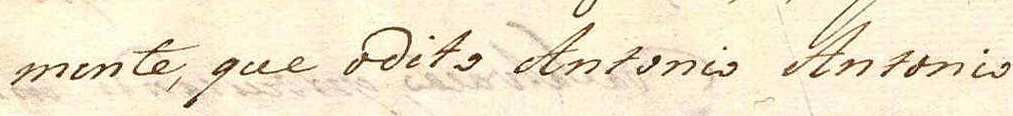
mente, que o dito Antonio Antonio
